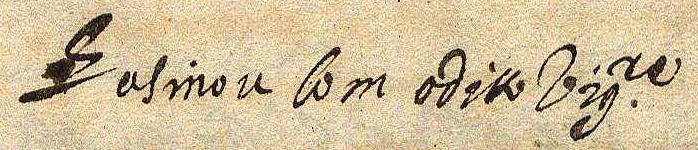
E asinou com o ditto Vig.ro
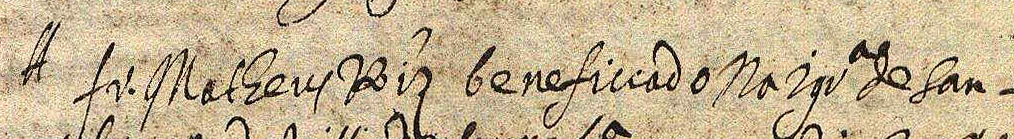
item fr. Matheus Roiz̄ beneficiado na igra de san
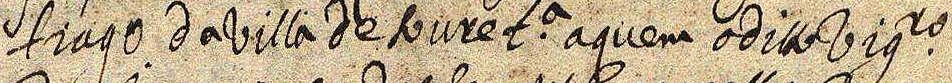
tiago da villa de soure t.a a quem o ditto vigro.
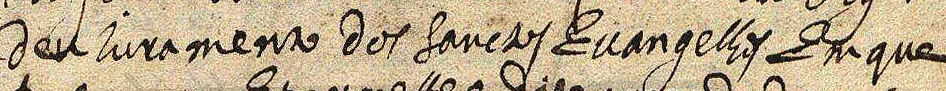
deu Iuramento dos sanctos Euangelhos Em que
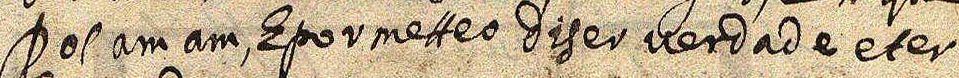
pos a mam, E pormetteo diser uerdade e ter
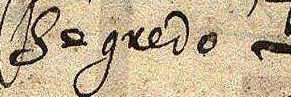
segredo -
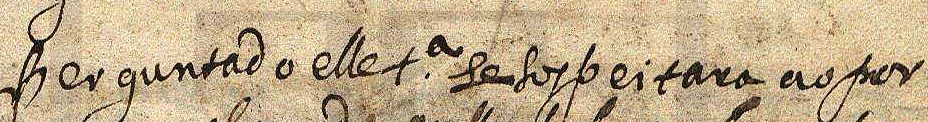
perguntado elle t.a se sospeitara ao por
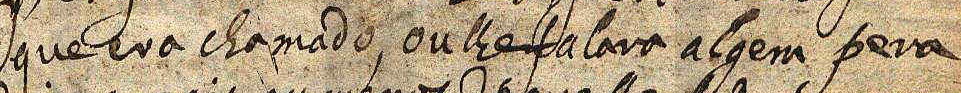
que era chamado, ou lhe falara algem pera
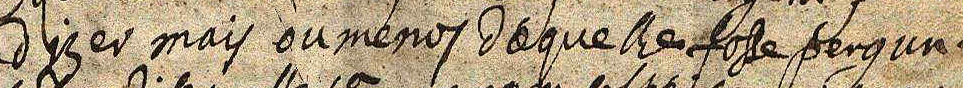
dizer mais ou menos do que lhe fosse pergun
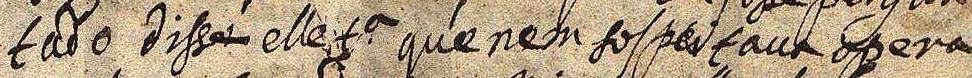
tado disse elle t.a que nem sospeitaua o pera
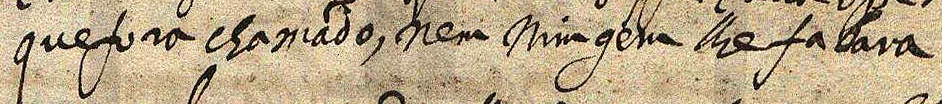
que fora chamado, nem nimgem lhe falara
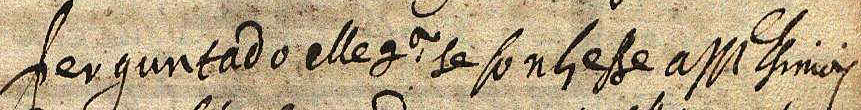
perguntado elle t.a se Conhesse a Mel simois
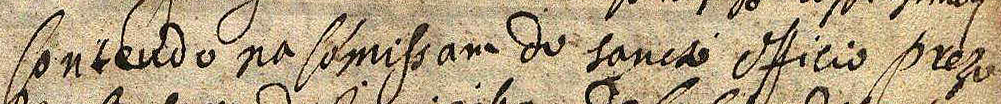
Conteudo na Com̄issam do sancto officio prezo
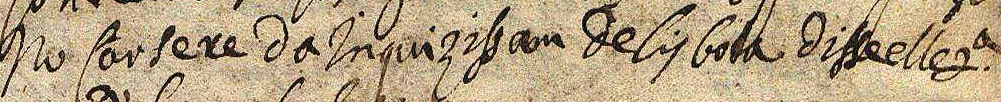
no Carsere da Inquizissam de lisboa disse elle t.a
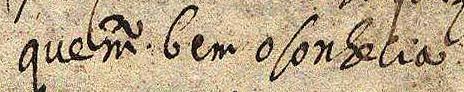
que m.to bem o Conhecia
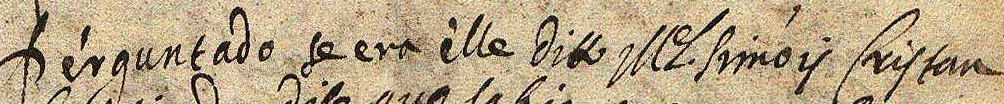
perguntado se era elle ditto Mel. simois Cristan
